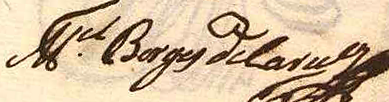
M.el Borges de Caru.o
